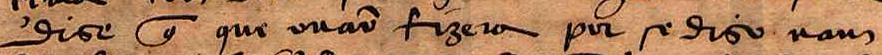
dise q̄ que o naõ fizera por se diso nam
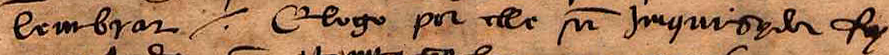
lembrar /. E logo por elle s̄or Jmquisydor foy
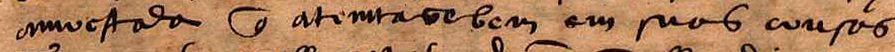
amoestada q̄ atemtase bem em suas cousas
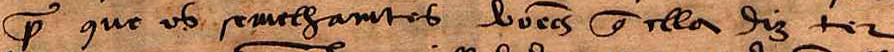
p̄o que os semelhamtes doõees q̄ ella diz ter
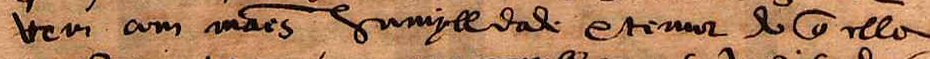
vem com māes humylldade e temor do q̄ ella
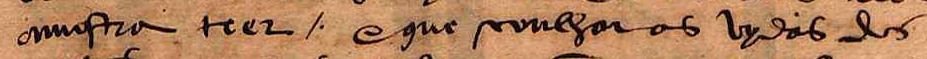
o mostra teer /. e que se oulhar as vydas dos
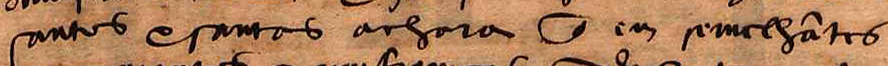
santos e santas achara q̄ em semelhātes
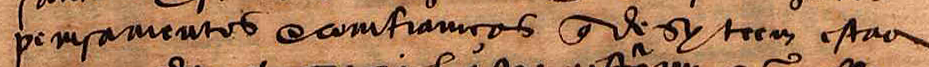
pemsamentos e comfiamças q̄ de sy teem estaa
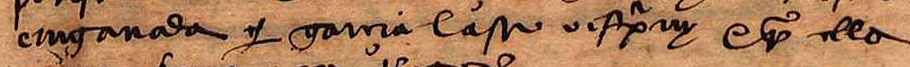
emganada c̄ꝭ garcia lasso o estp̄uy e p̄o ella
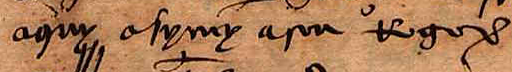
aquy asyney a seu Rogo
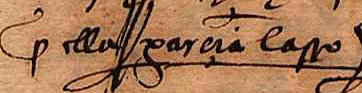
p̄o ella garcia lasso
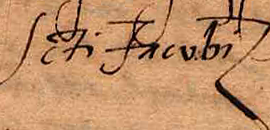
Sc̄ti Jacobi
